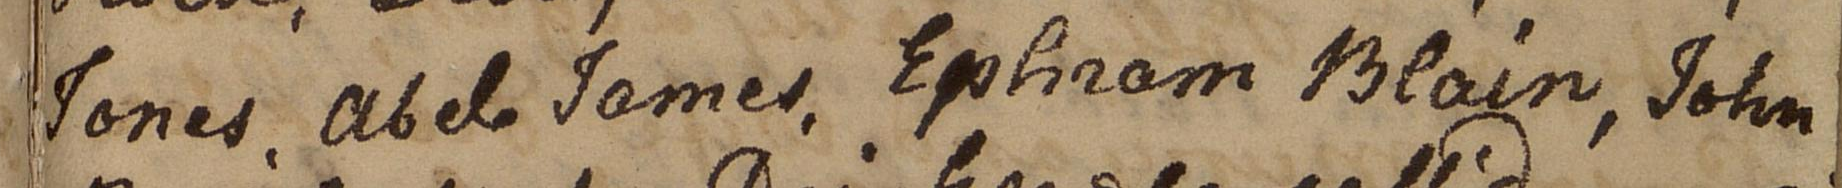Jones, Abel James, Ephram Blain, John
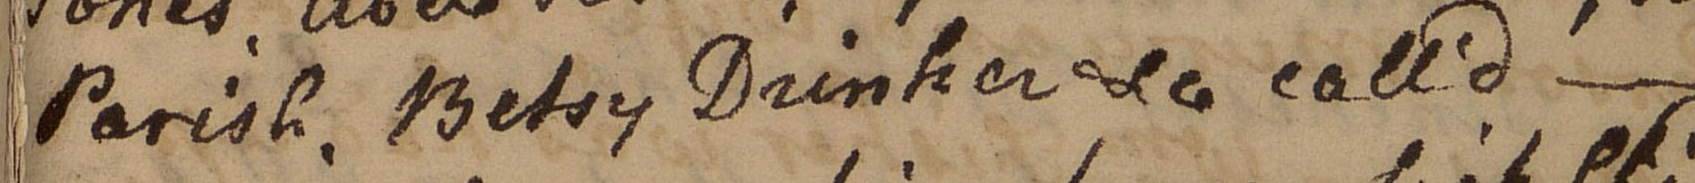Parish, Betsy Drinker &c call'd-
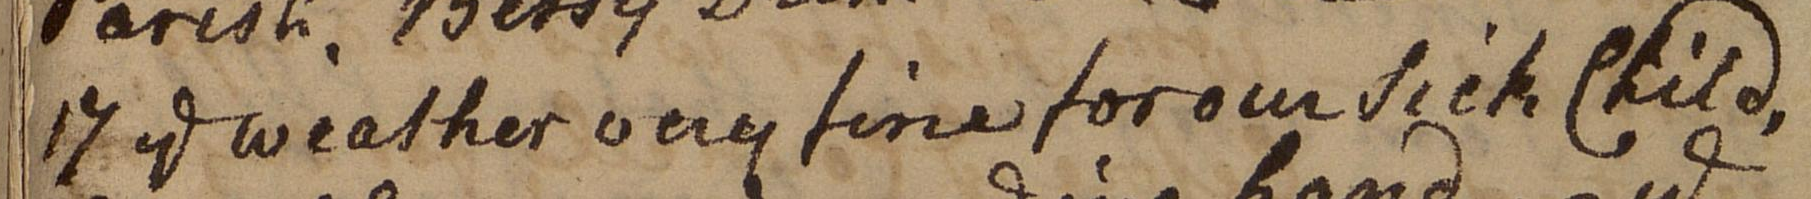17 y^e weather very fine for our Sick Child,
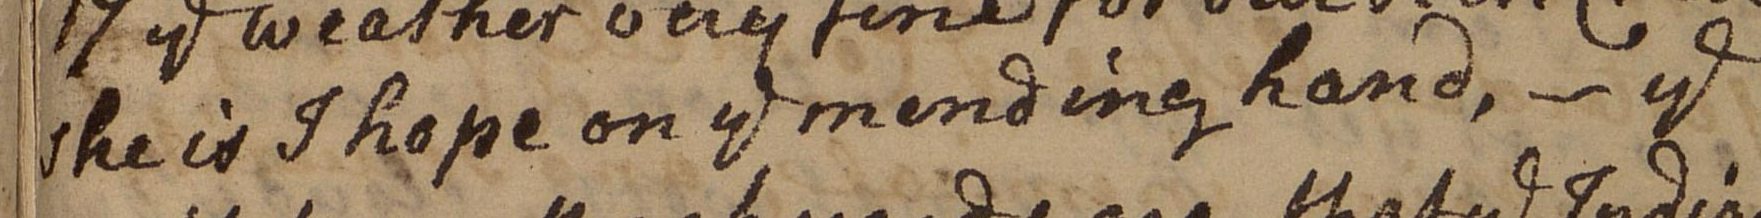she is I hope on y^e mending hand.- y^e
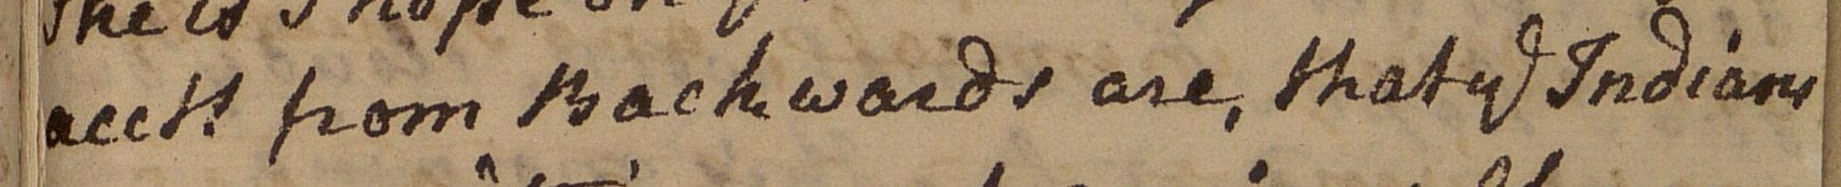acct.^s from Backwards are, that y^e Indians
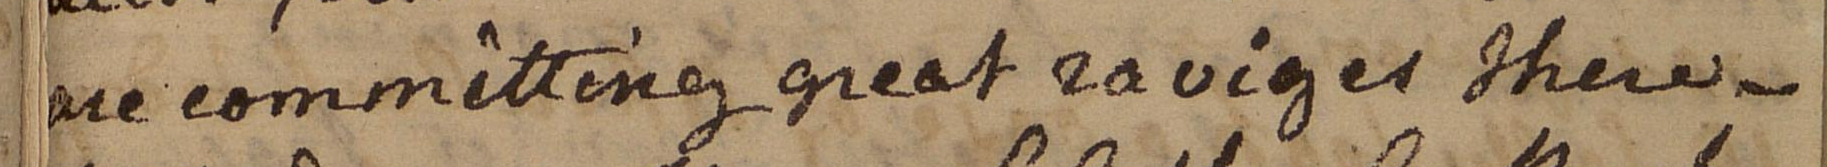are committing great raviges there-
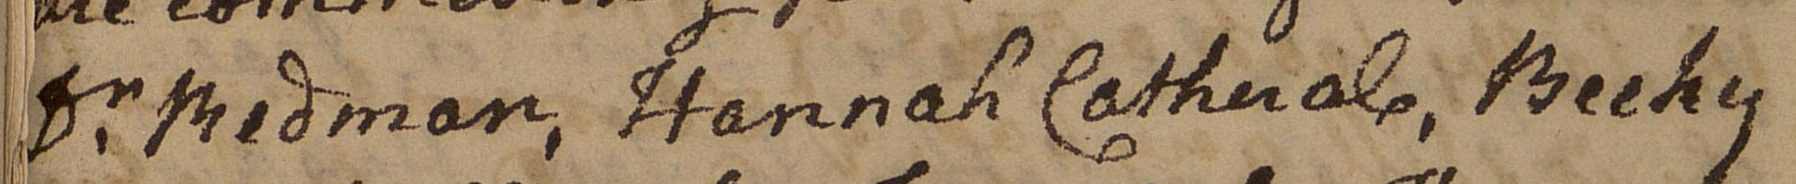D^r. Redman, Hannah Catheral, Becky
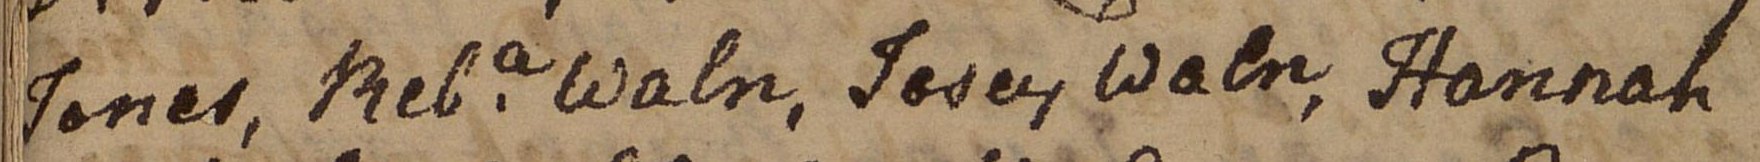Jones, Reb.^a Waln, Josey Waln, Hannah
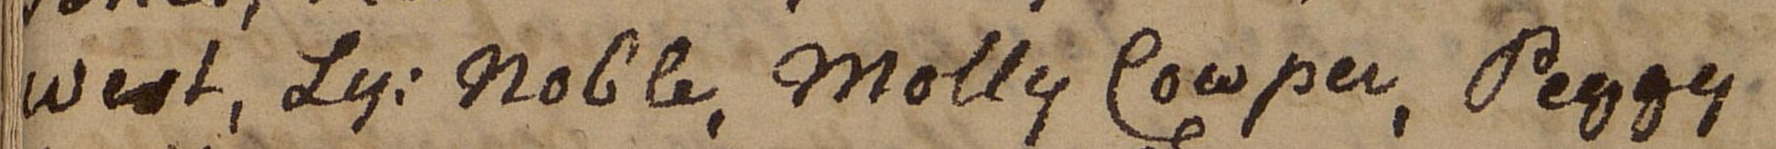West, Ly: Noble, Molly Cowper, Peggy
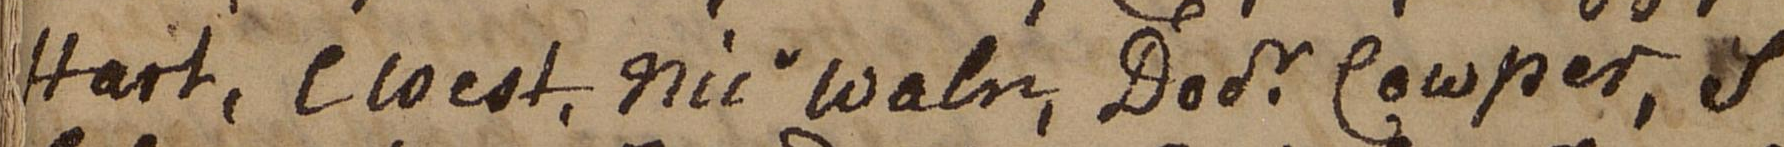Hart, cloest, Nic^s Waln, Doc^r. Cowper, J
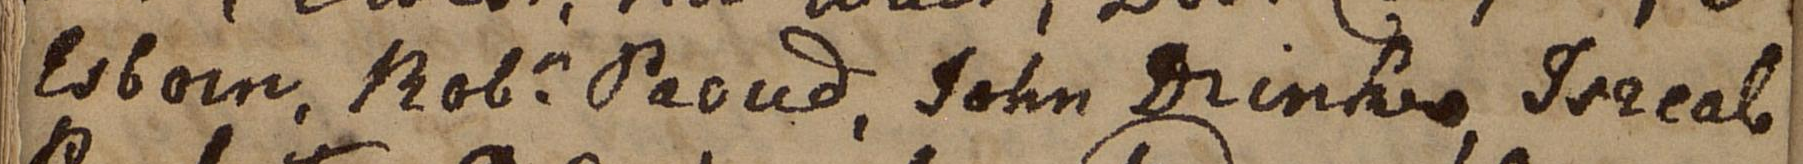Esborn, Rob^r. Proud, John Drinker, Isreal
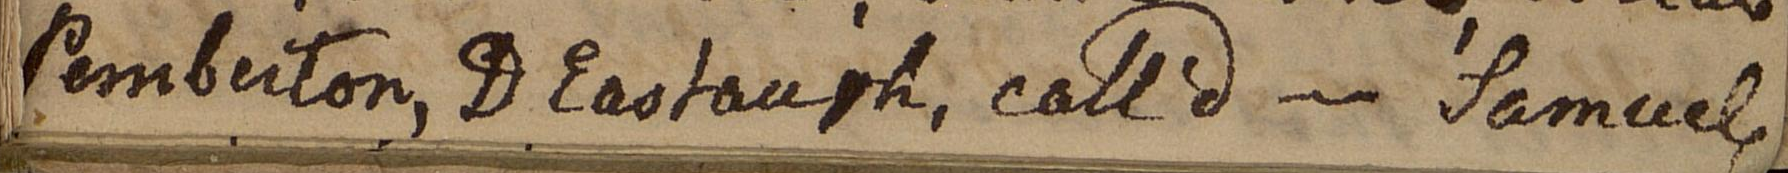Pemberton, D Eastaugh, call'd- Samuel
